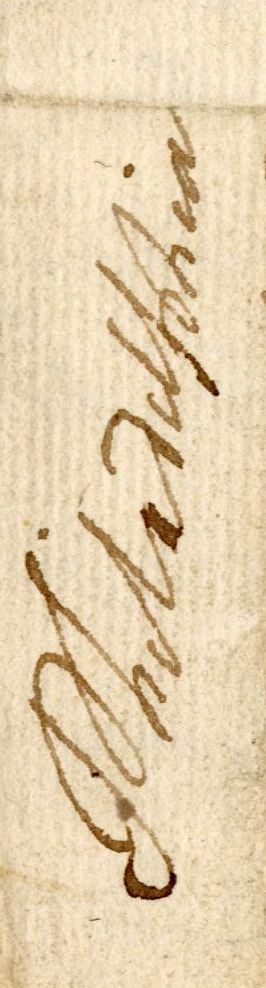Philadelphia
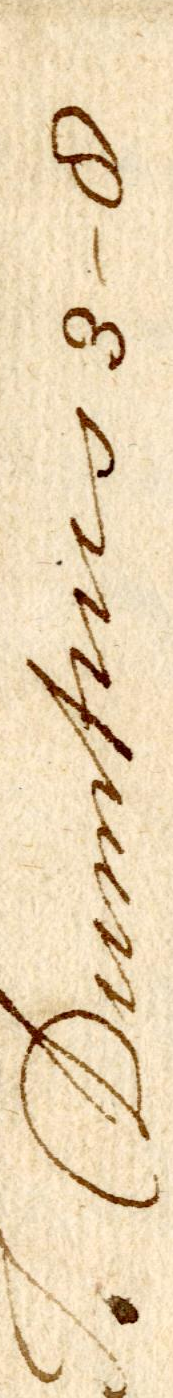To Dumpries 3-8
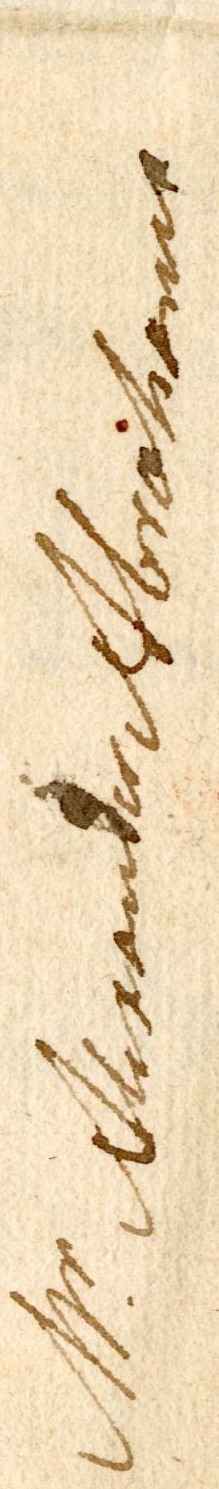M^r Alexander Abraham
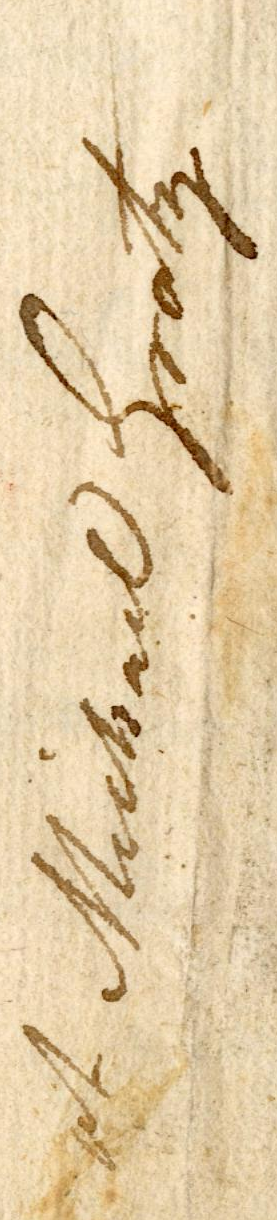at Michael Gratz
